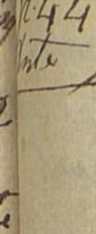Ante
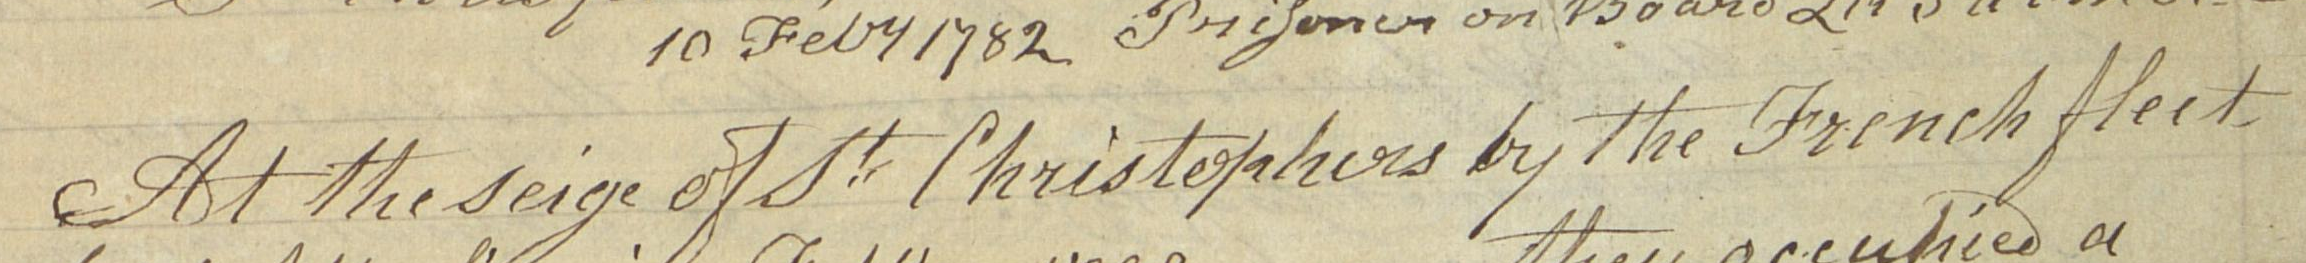At the seige of S^t. Christophers by the French fleet
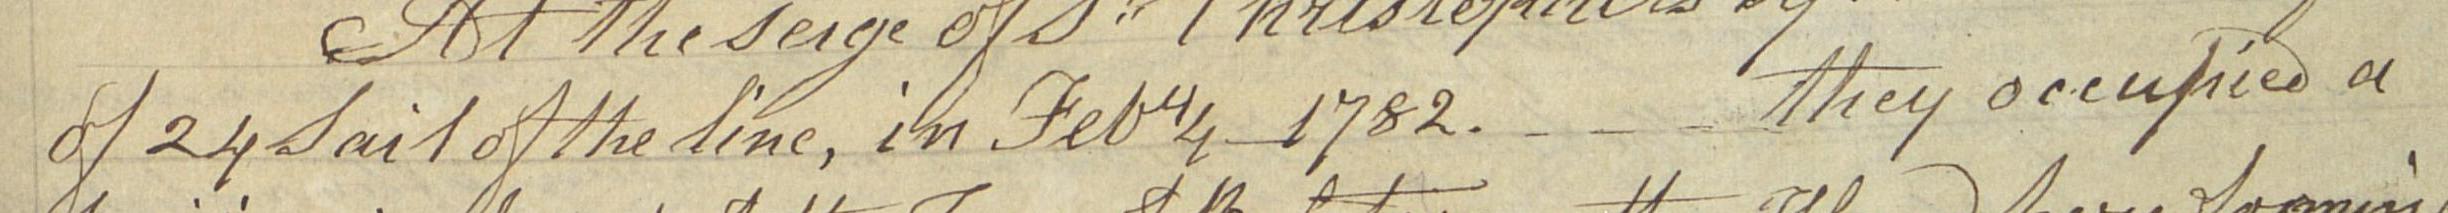of 24 Sail of the Line, in Feb^y 1782.-- they occupied a
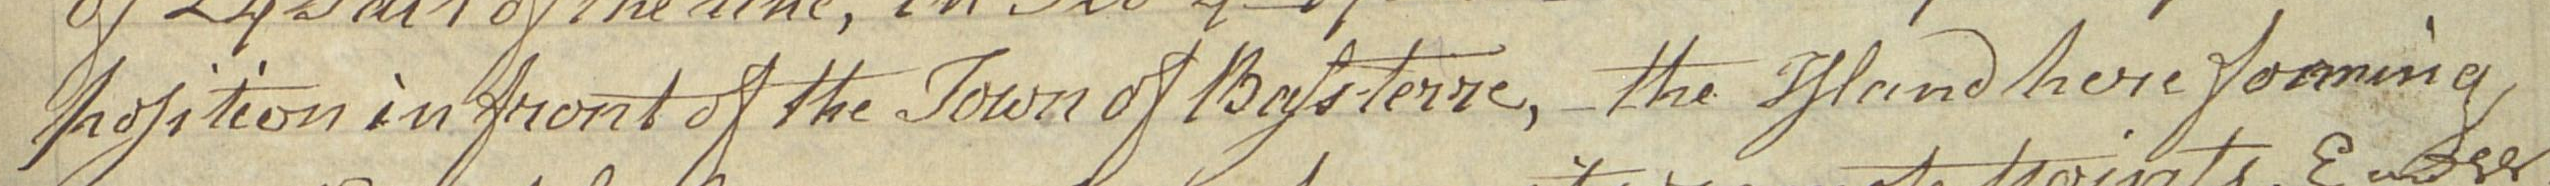position in front of the Town of Bassterre, the Island here forming
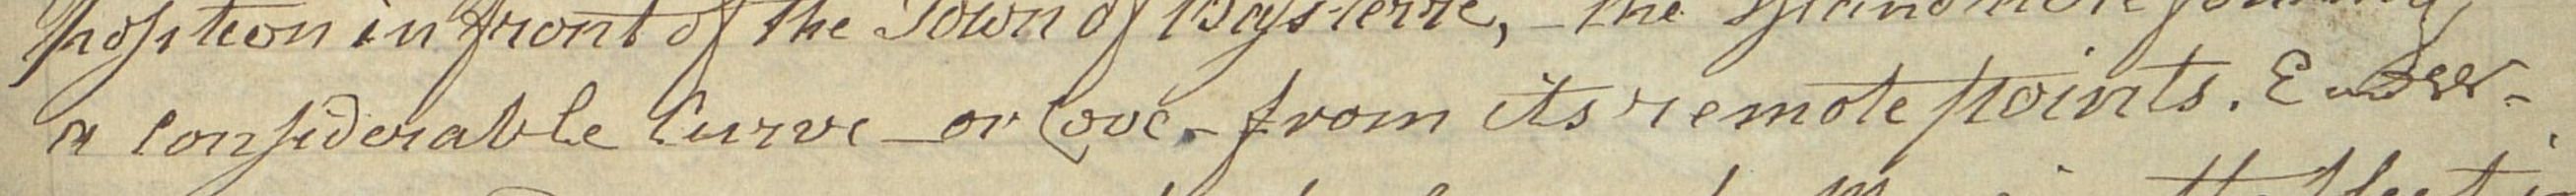a considerable Curve- or Cove from its remote points. E and W
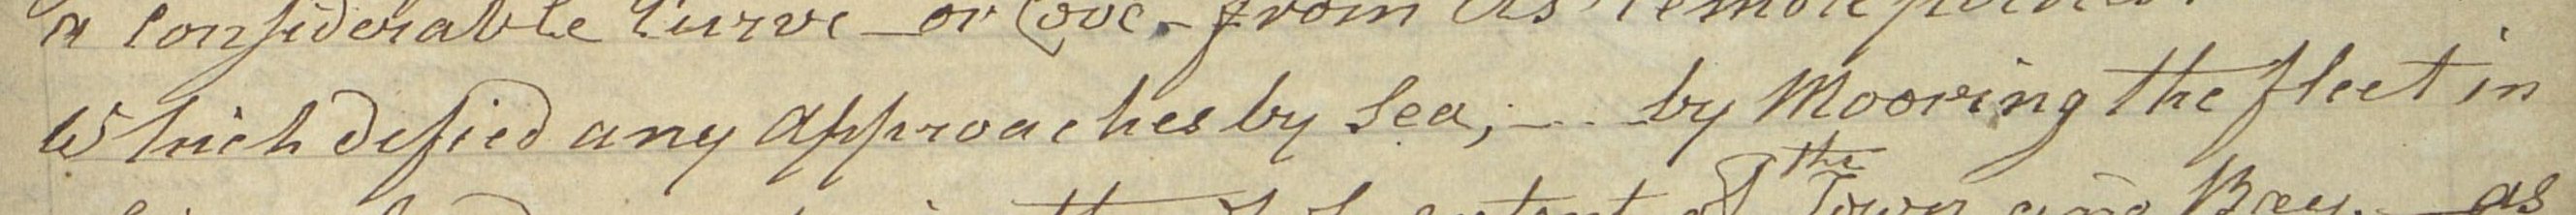Which defied any Approaches by sea, by Mooring the fleet in
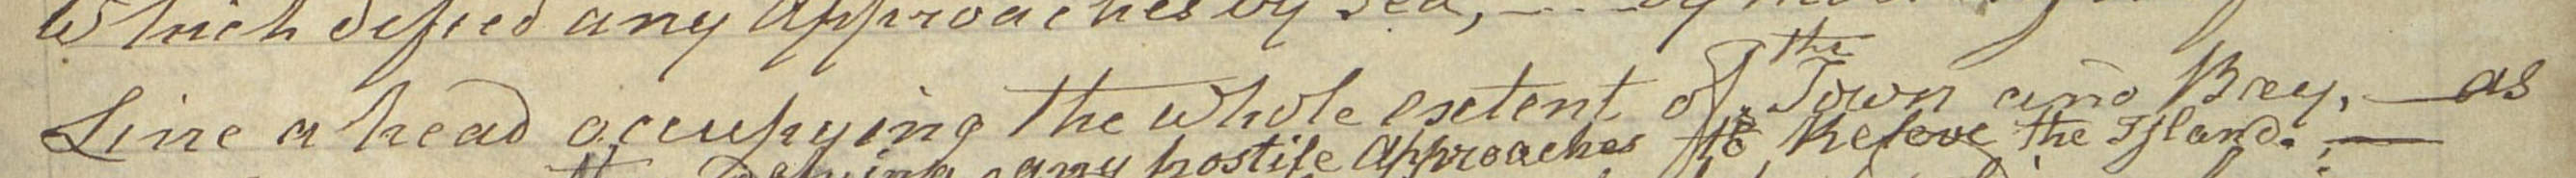Line a head occupying the whole extent of Town and Bay, as
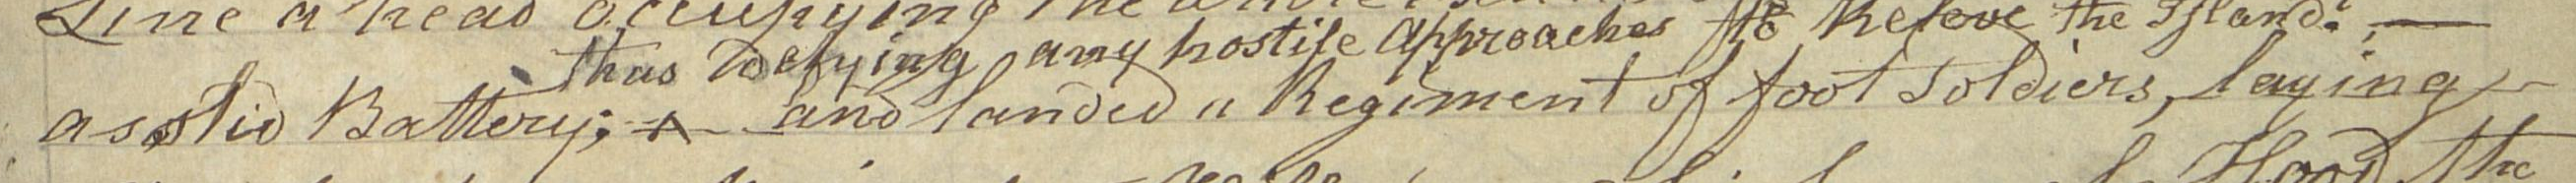a solid Battery; ^ and landed a Regiment of foot Soldiers, laying
